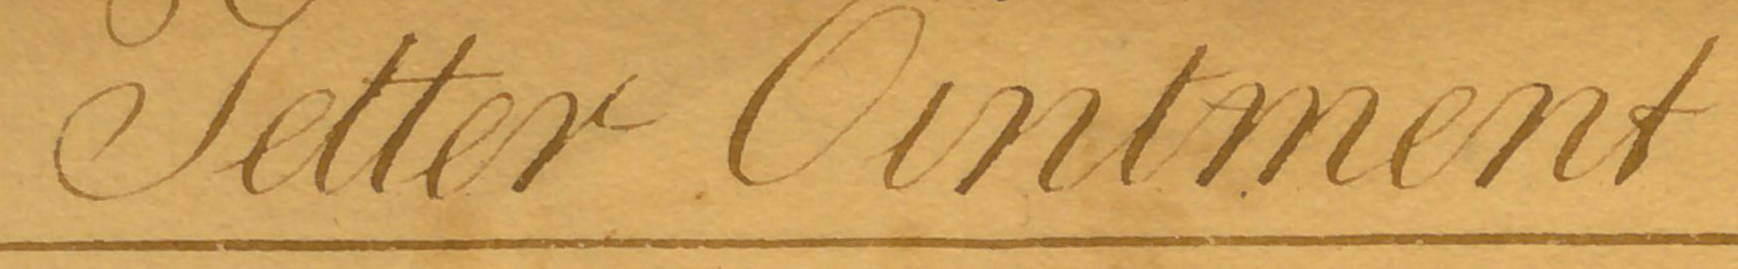Tetter Ointment
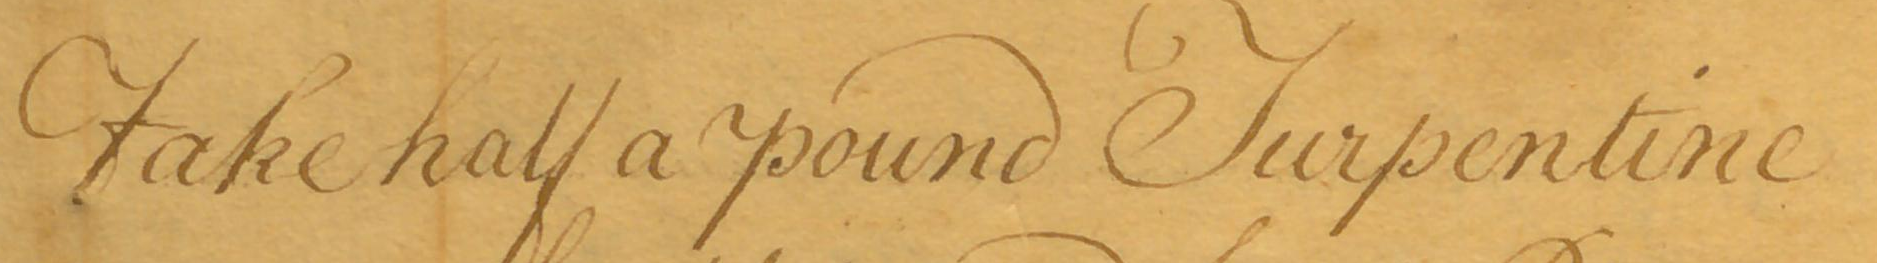Take half a pound Turpentine
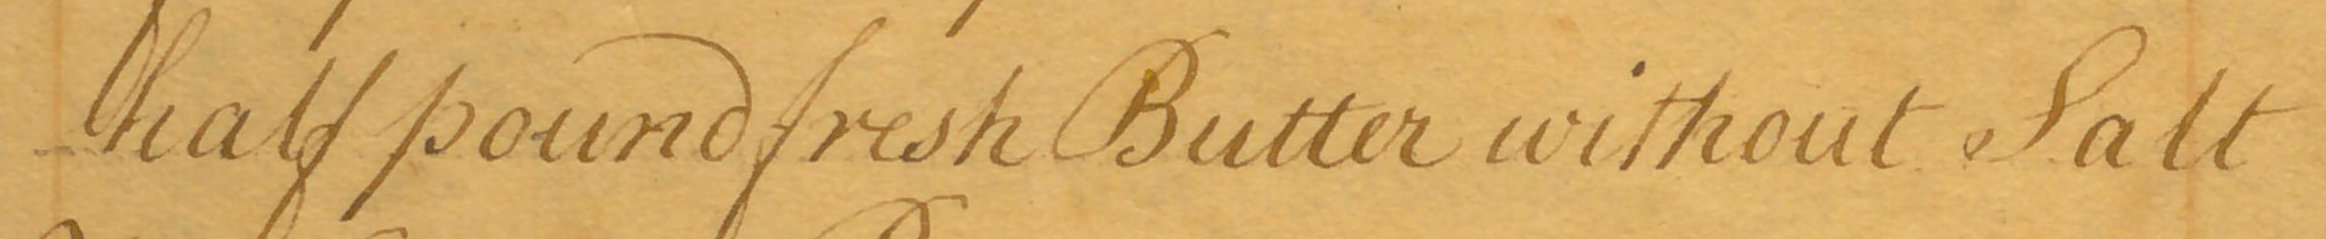half pound fresh Butter without Salt
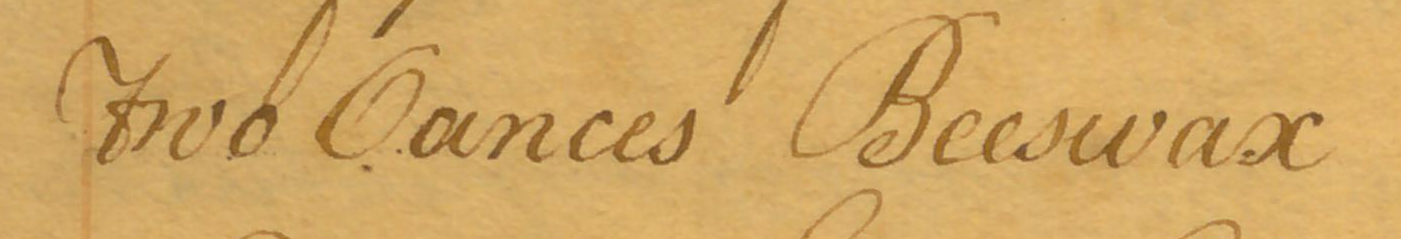two Ounces Beeswax
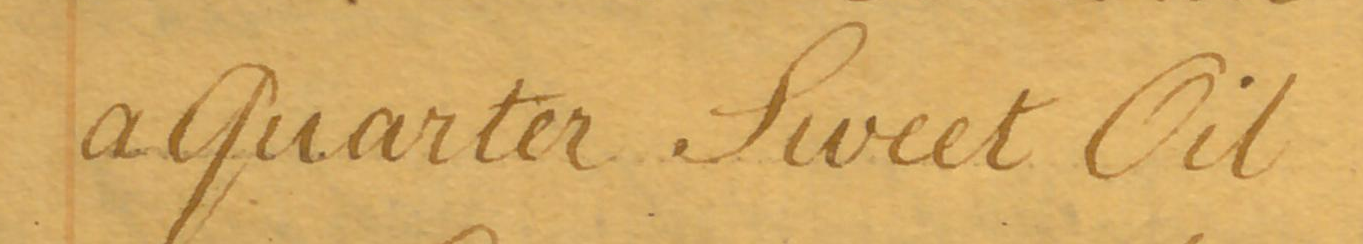a quarter Sweet Oil
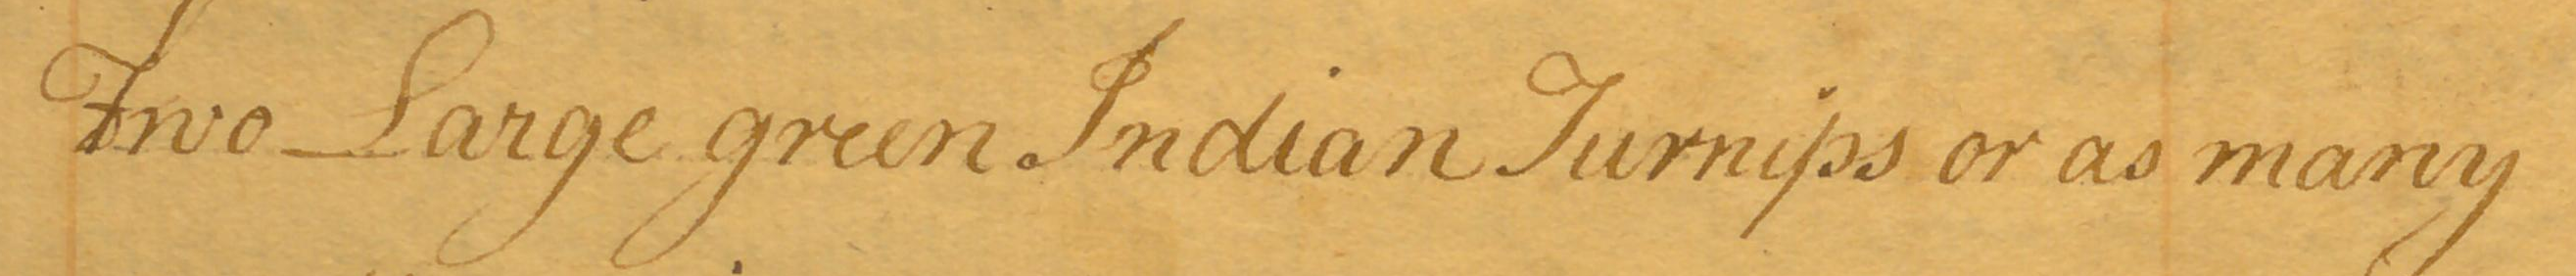Two Large green Indian Turnips or as many
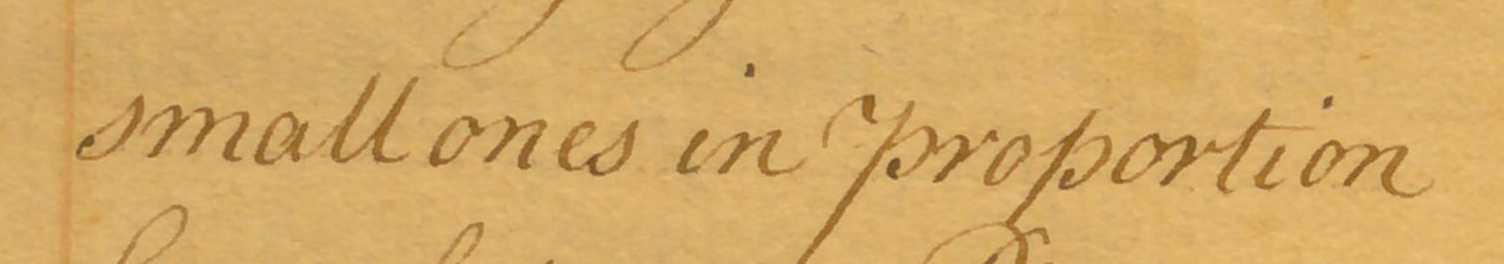small ones in proportion
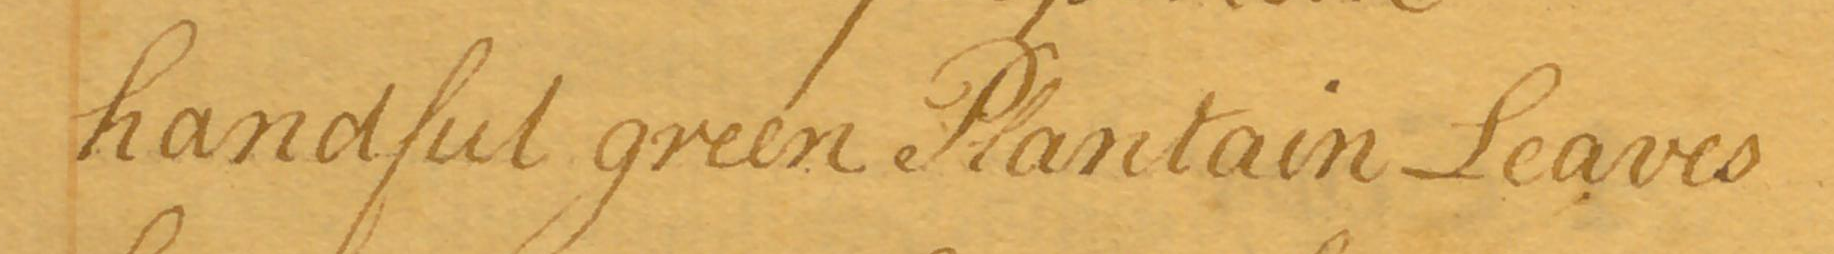handful green Plantain Leaves
